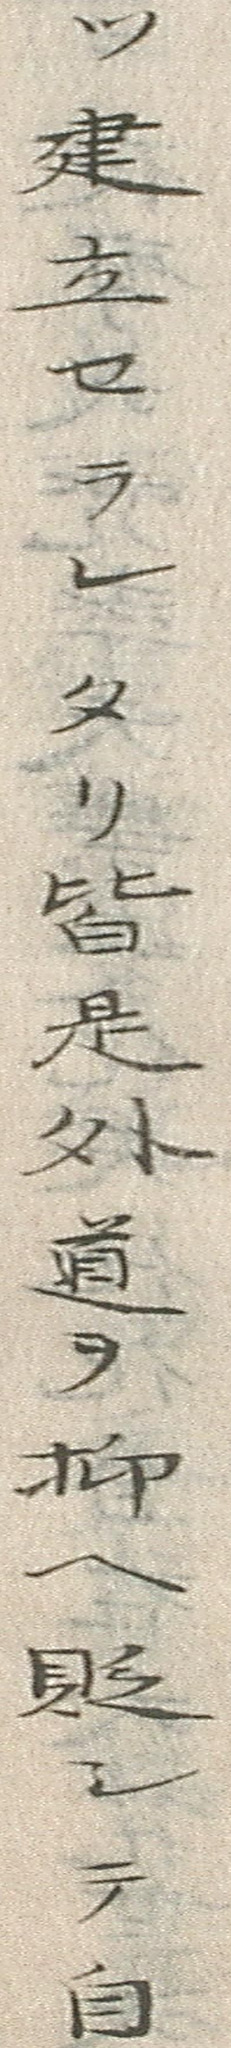ッ建立セラレタリ皆是外道ヲ抑ヘ貶シテ自
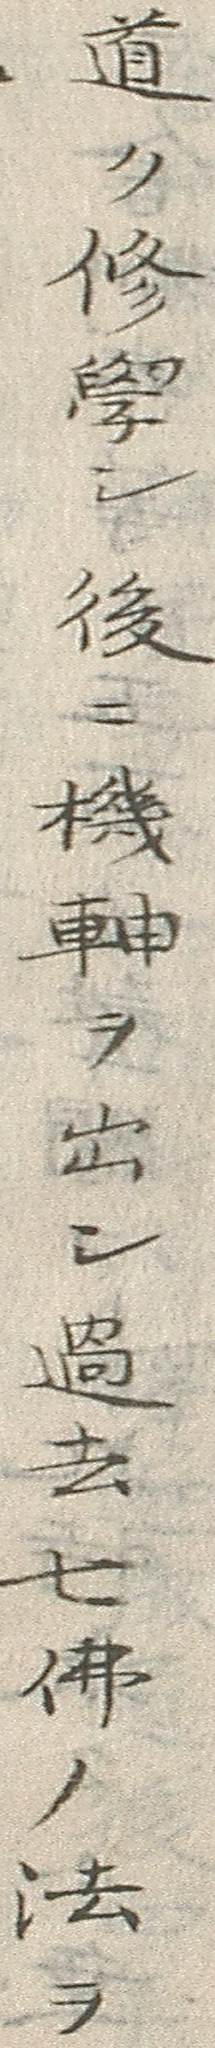道〃修学シ後ニ機軸ヲ出シ過去七仏ノ法ヲ
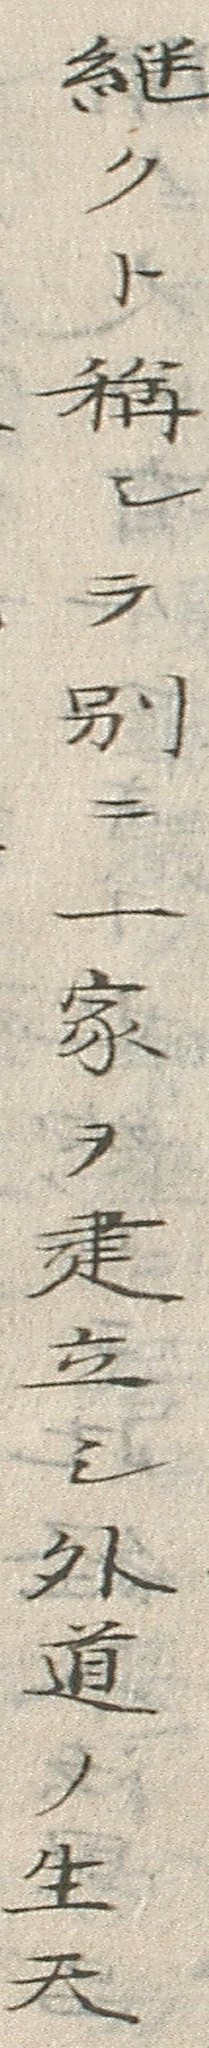継クト称シテ別ニ一家ヲ建立シ外道ノ生天
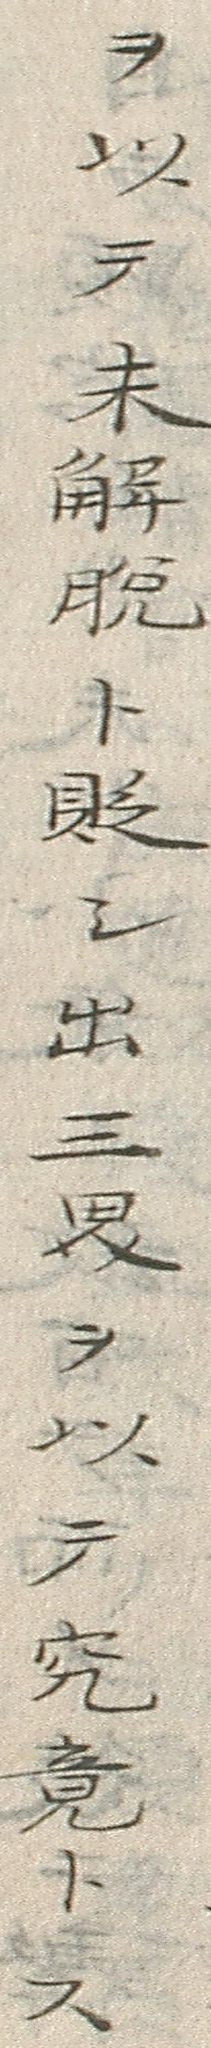ヲ以テ未解脱ト貶シ出三界ヲ以テ究竟トス
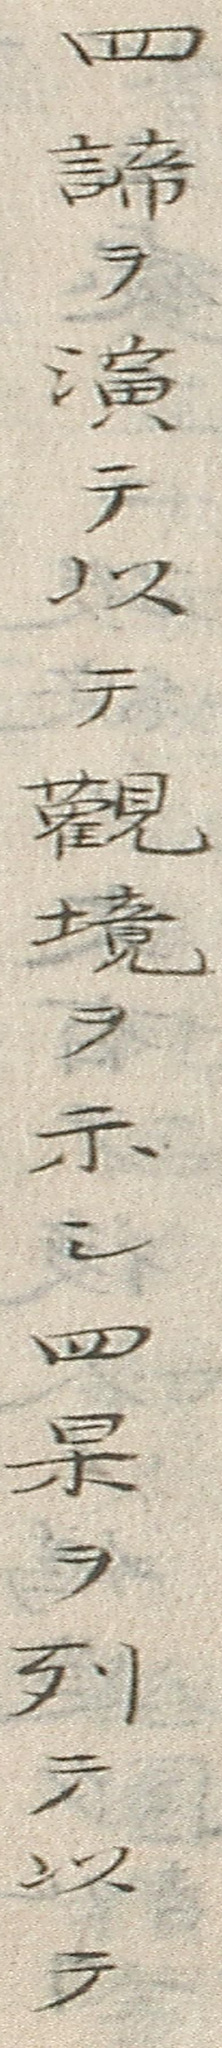四諦ヲ演テ以テ観境ヲ示シ四果ヲ列テ以テ
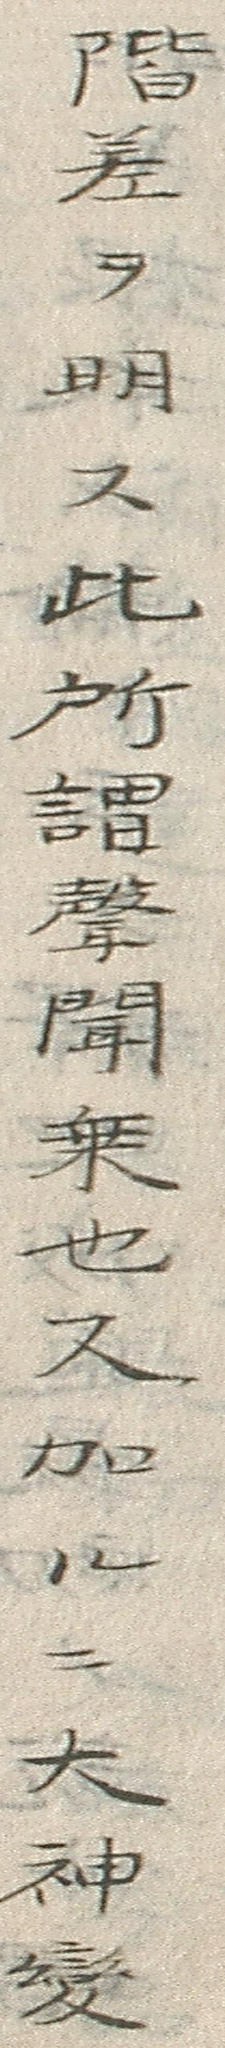階差ヲ明ス此所謂声聞乗也又加ルニ大神変
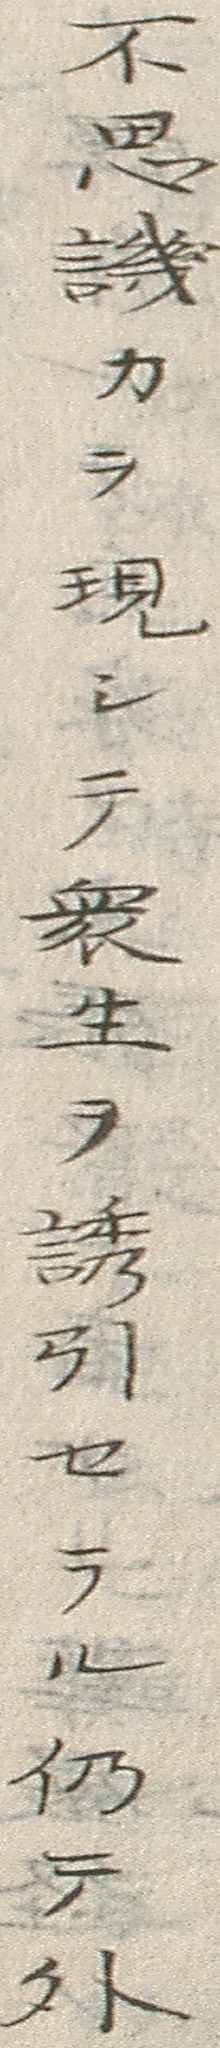不思議カヲ現シテ衆生ヲ誘引セラル仍テ外
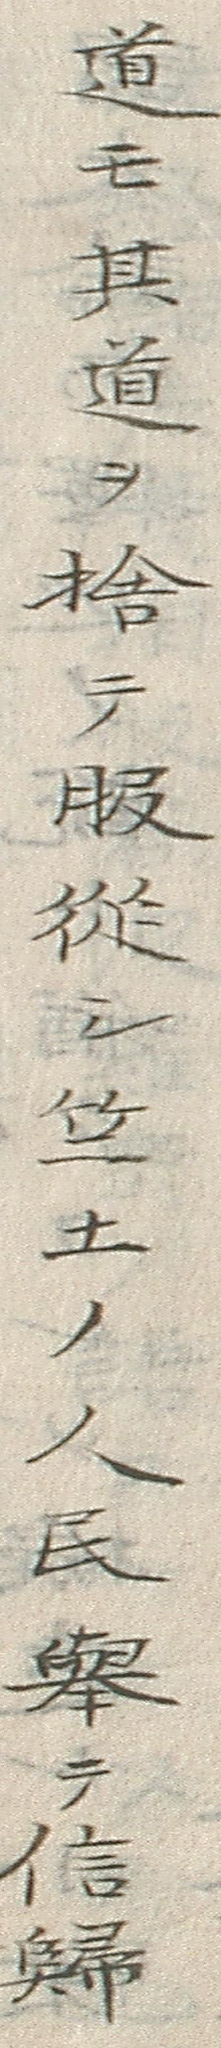道モ其道ヲ捨テ服従シ竺土ノ人民挙テ信帰
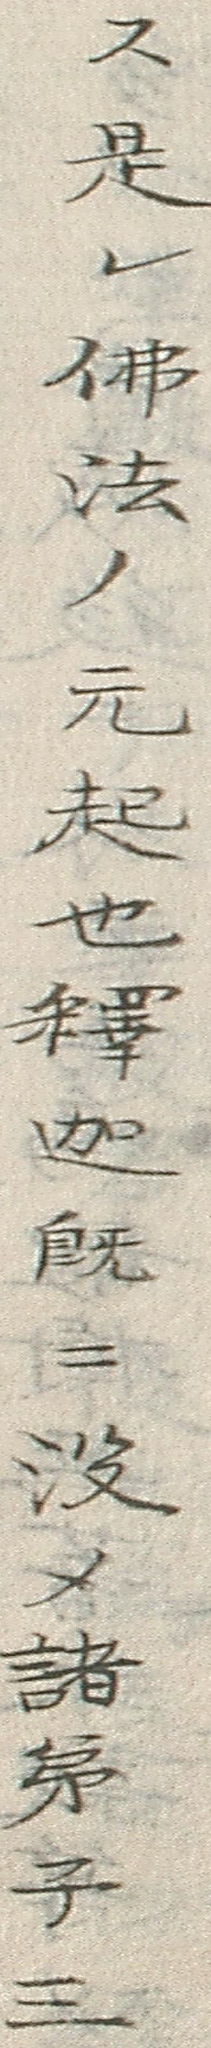ス是レ仏法ノ元起也釈迦既ニ没シテ諸第子三
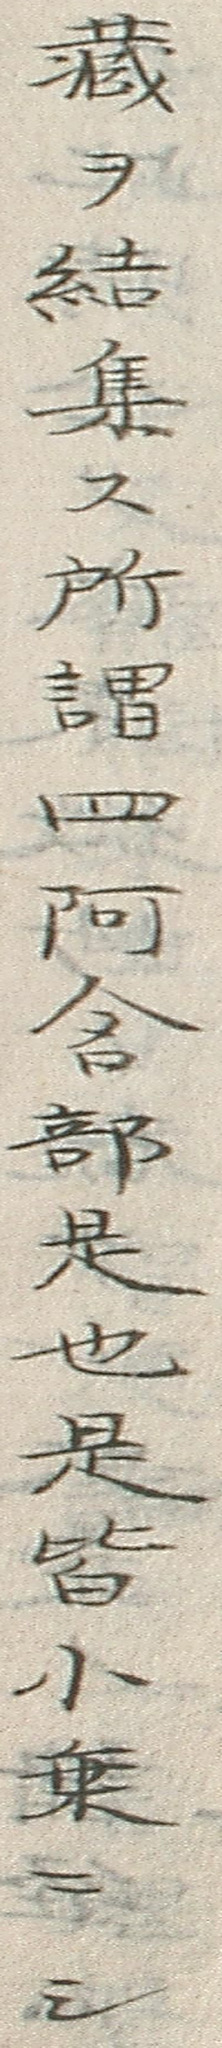蔵ヲ結集ス所謂四阿含部是也是皆小乗ニシ

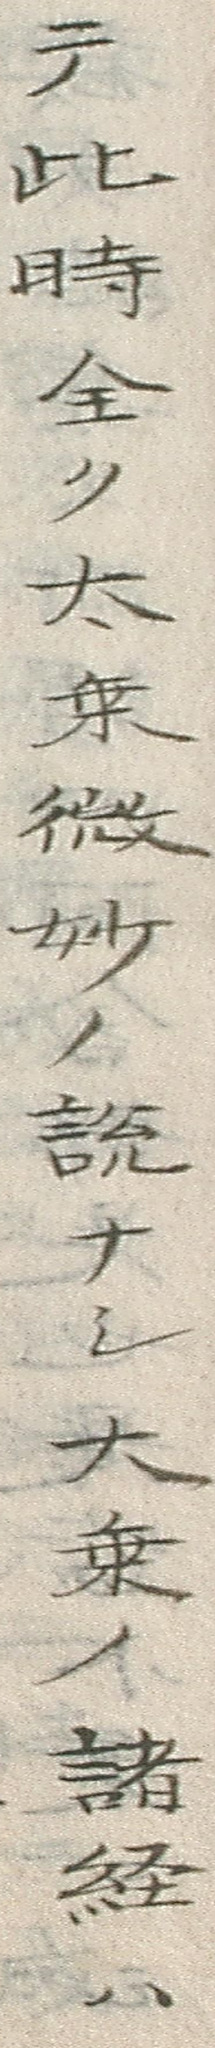テ此時全ク太乗微妙ノ説ナシ大乗ノ諸経ハ
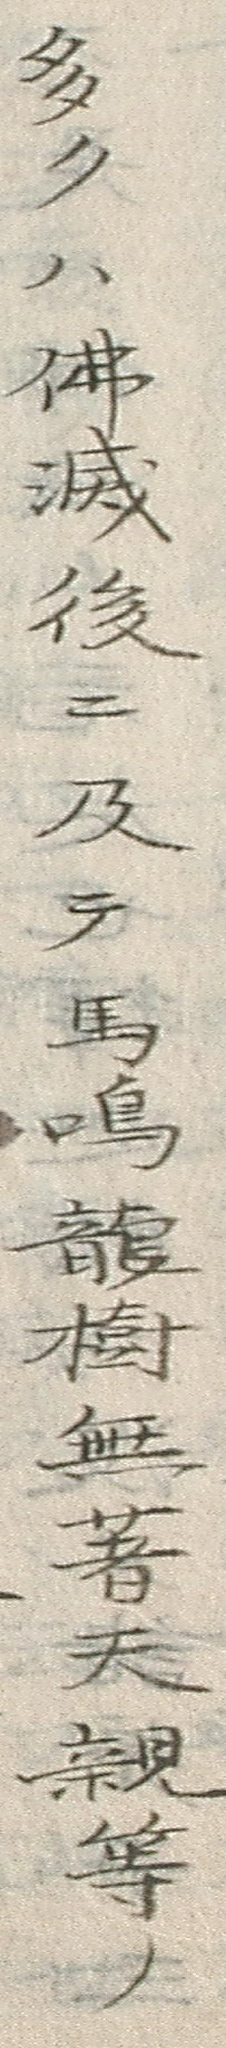多クハ仏滅後ニ及テ馬鳴龍樹無著天親等の
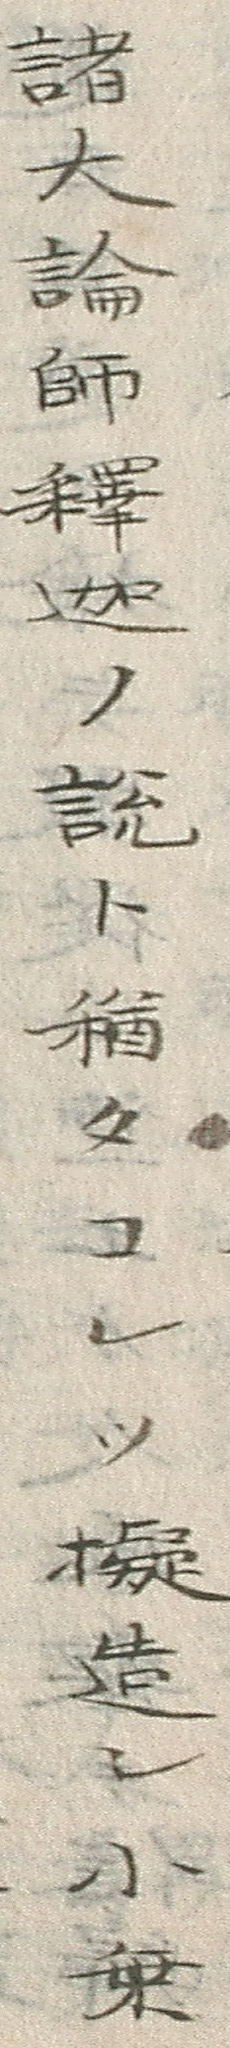諸大輪師釈迦ノ説ト称タコレツ擬造シ小乗
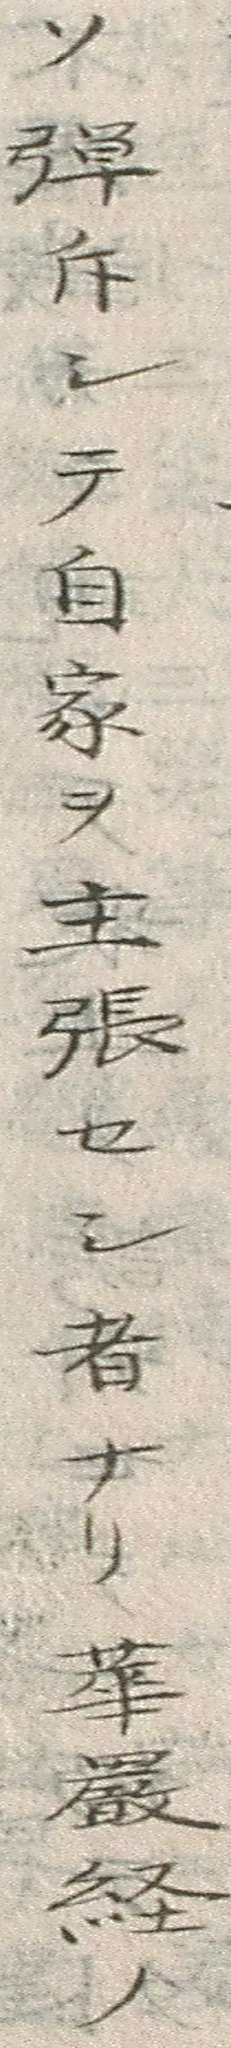ソ弾斤シテ自家ヲ主張セシ者ナリ華厳経ノ
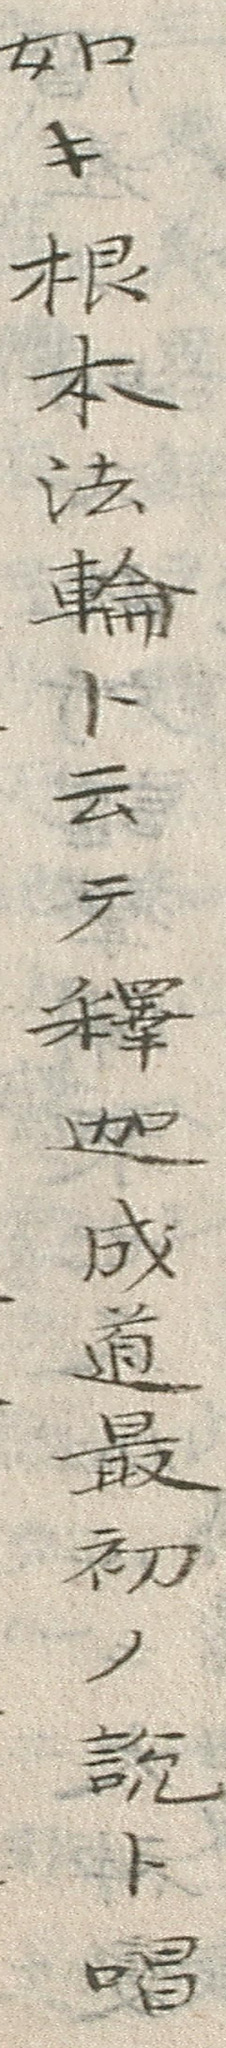如キ根本法輪ト云テ釈迦成道最初ノ説ト唱
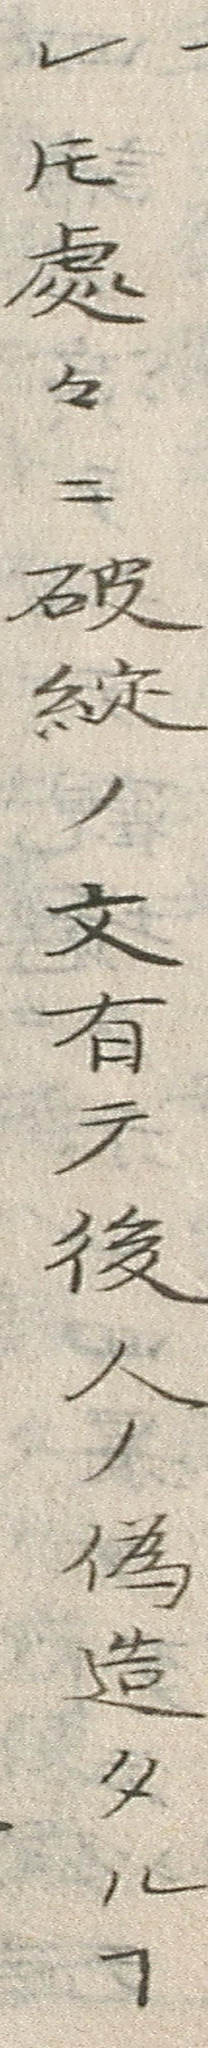レトモ処々ニ破綻ノ文有テ後人ノ偽造タルコト
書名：天學略名目羽翼　全
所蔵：東京大学地震研究所図書室 Earthquake Research Institute Library, The University of Tokyo, JAPAN
